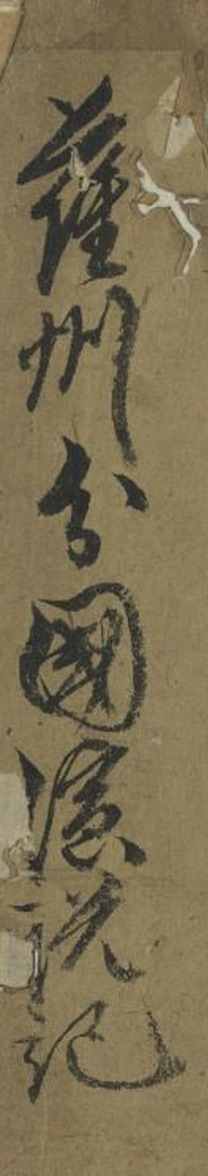薩州分国演説記

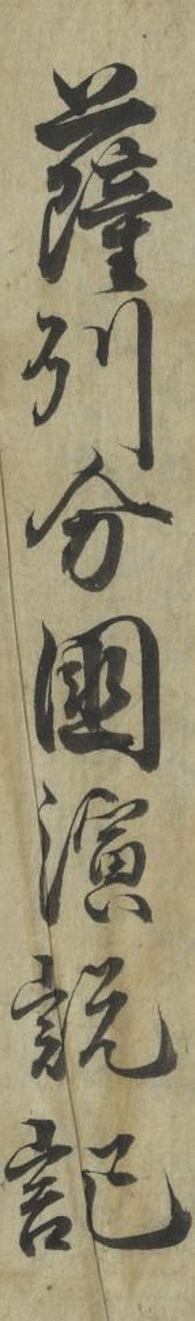薩州分国演説記
